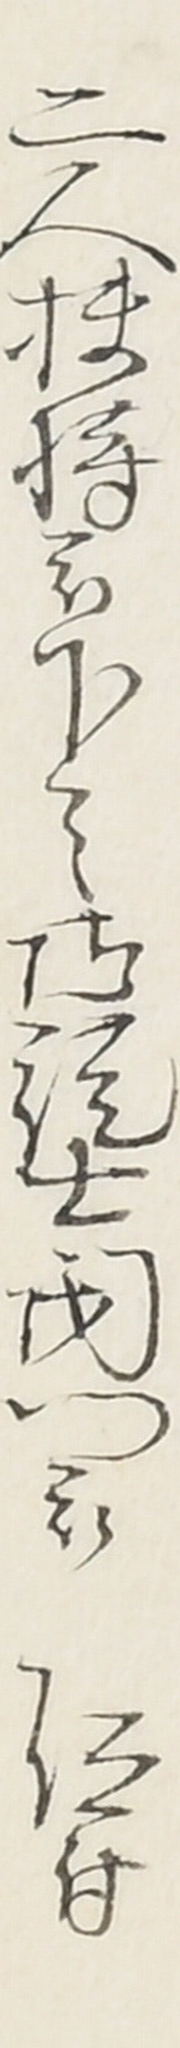二人扶持被下之御徒士閉門被仰付
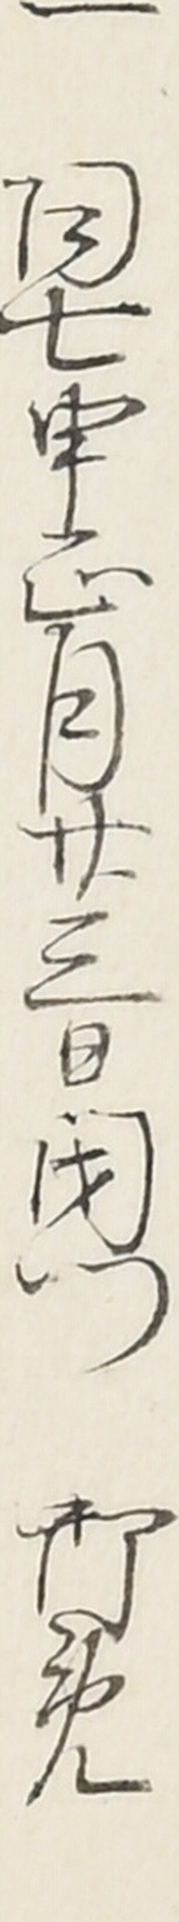一同七申正月廿三日閉門御免
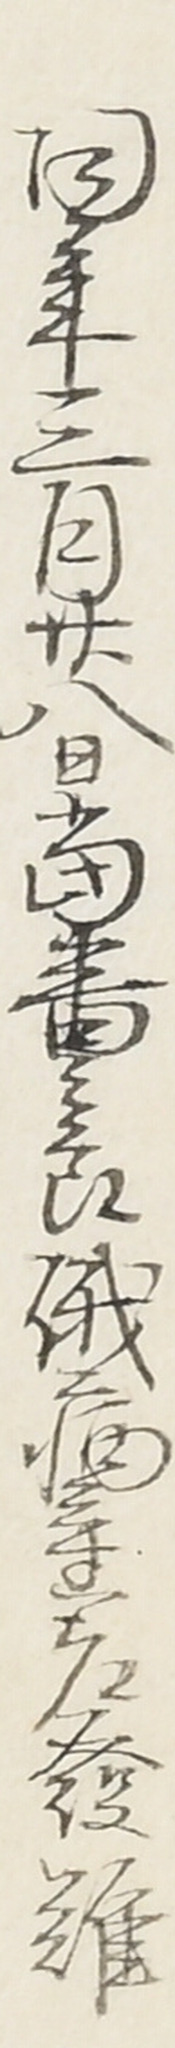一同年三月廿八日当番之節俄病気差発難
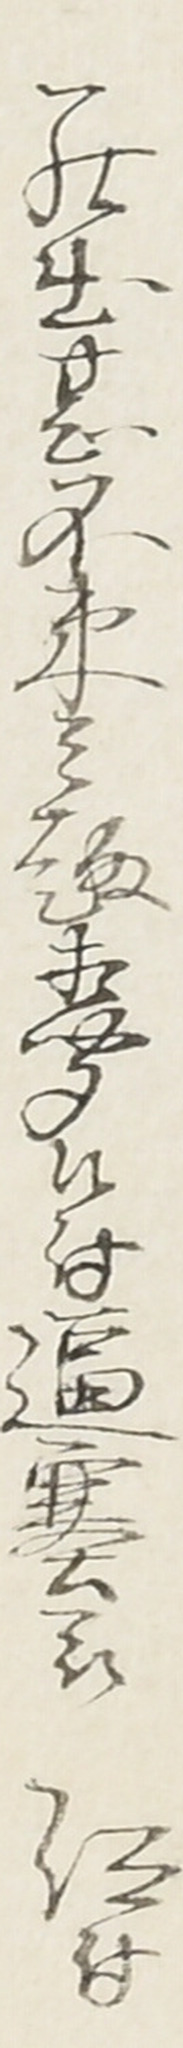罷出甚不束之趣相聞候付逼塞被仰付
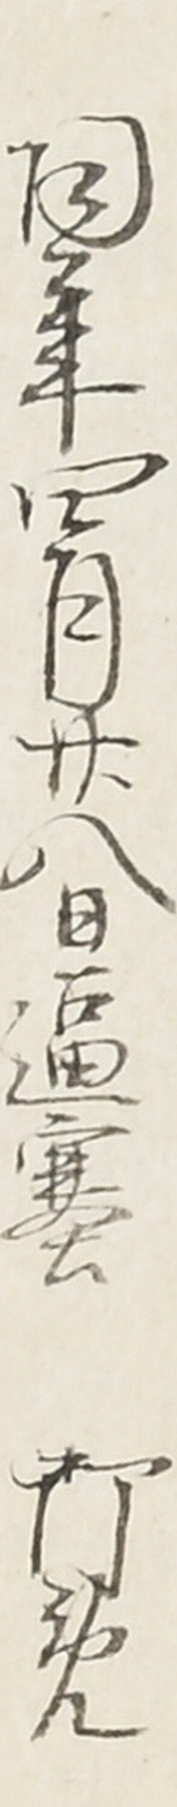一同年四月廿八日逼塞御免
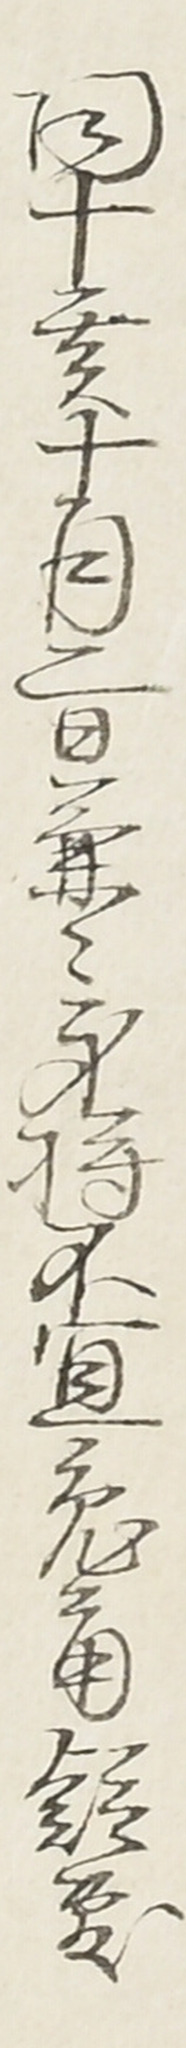一同十亥十月二日兼々身持不宜兎角疑敷
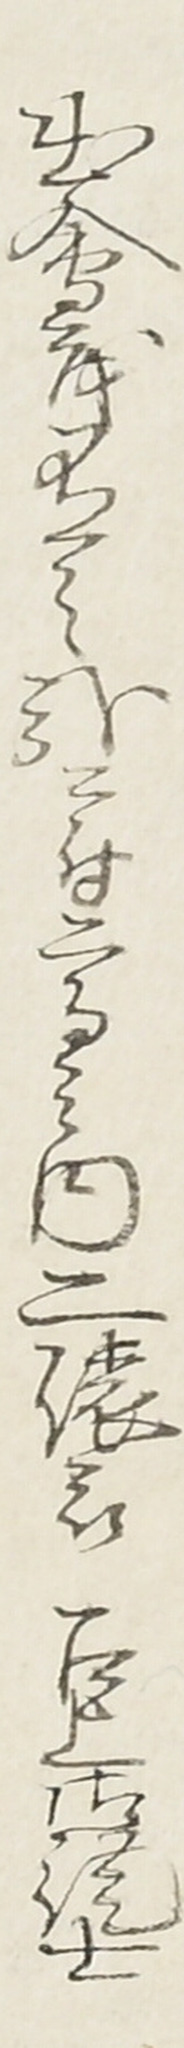出会茂有之哉ニ付高之内二俵被召上御徒士
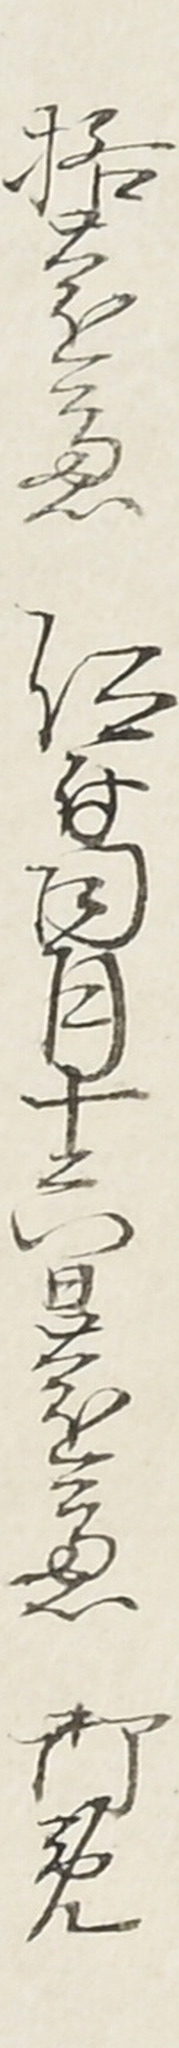格遠慮仰付同月十六日遠慮御免
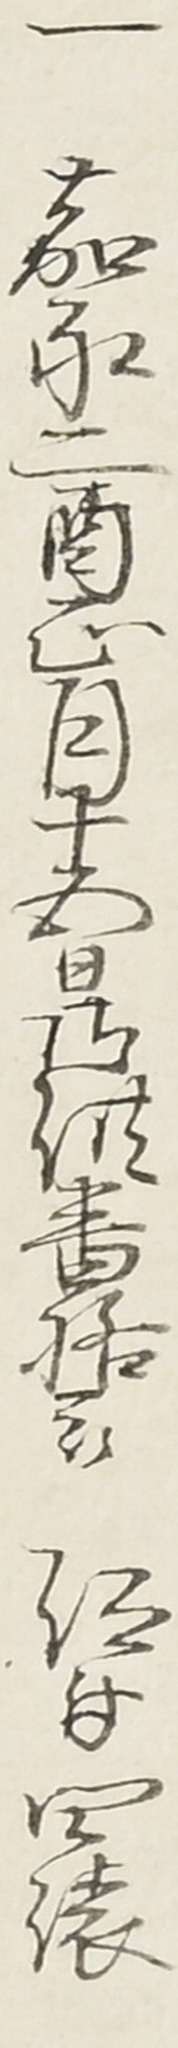一嘉永二酉正月十五日御供番格被仰付四俵
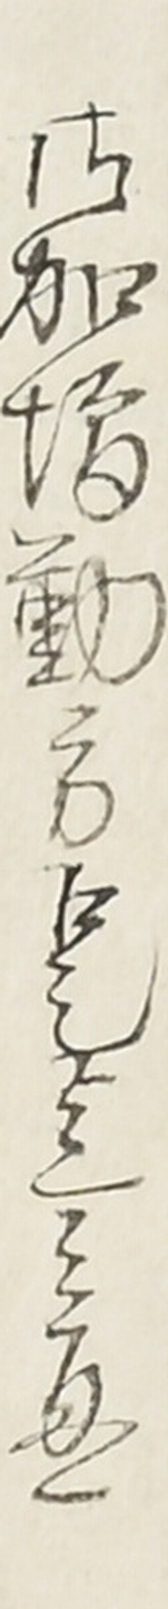御加増勤方是迄之通
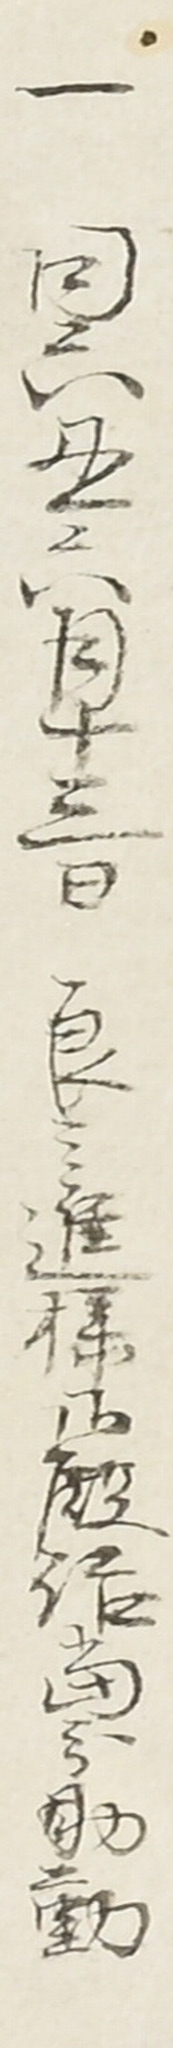一同六丑六月十三日良之進様御殿詰当分助勤
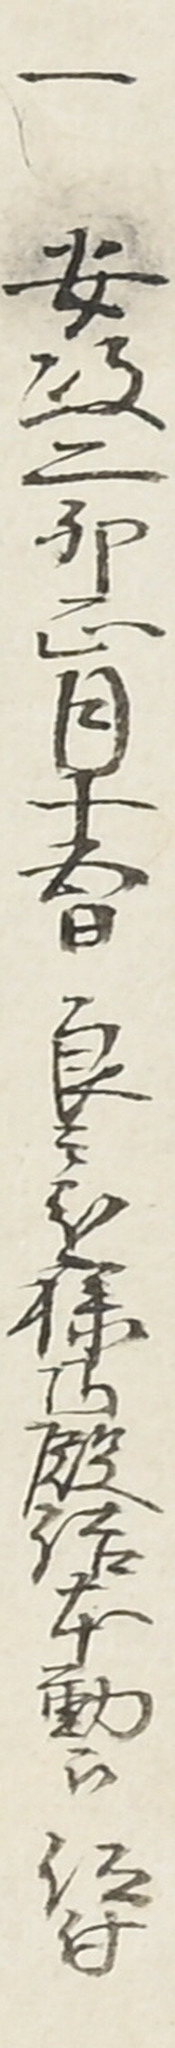一安政二卯正月十五日良之進様御殿詰本勤被仰付
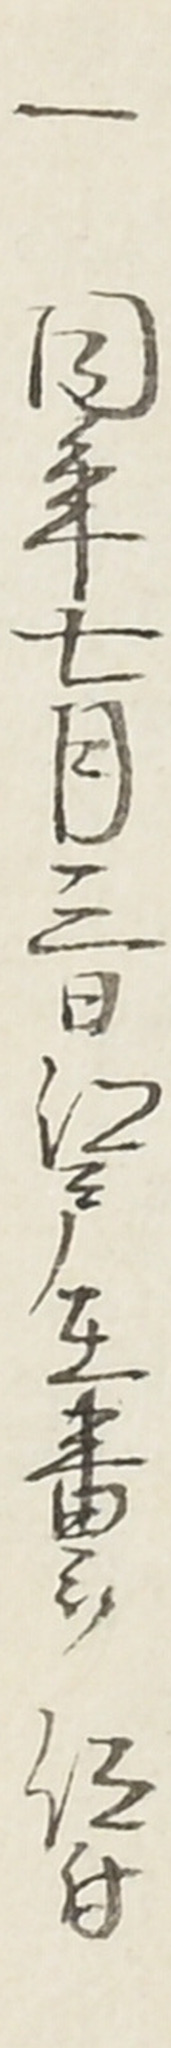一同年七月三日江戸在番被仰付
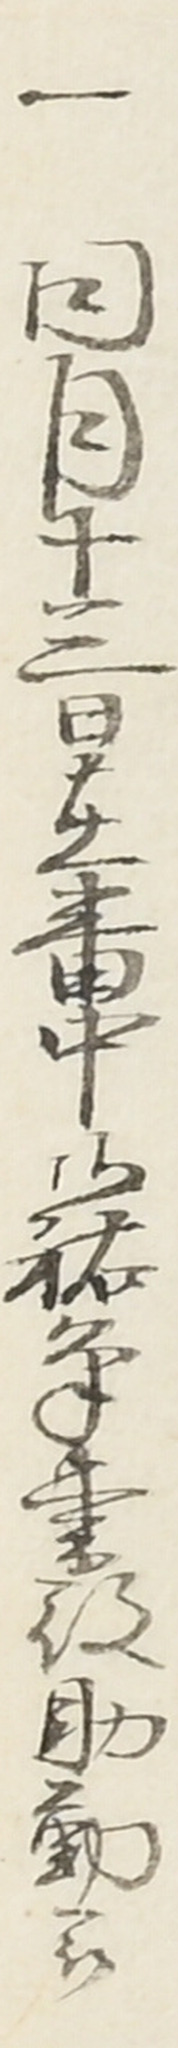一同月十三日在番中御祐筆書役助勤被

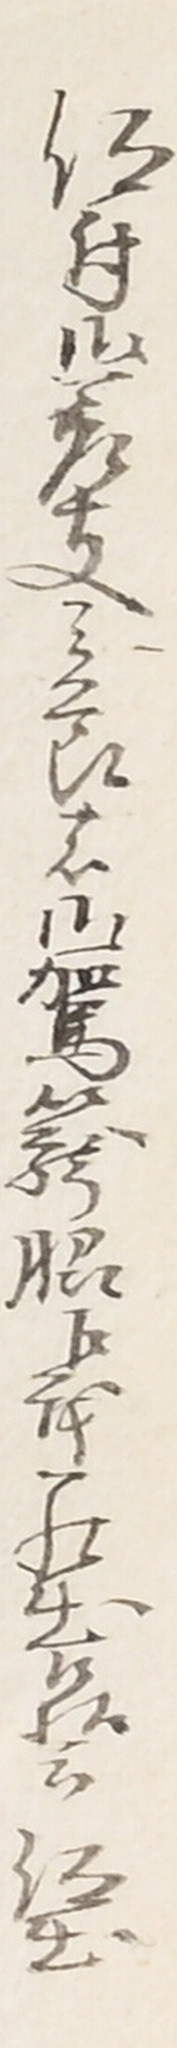仰付御差支之節者御駕籠脇江茂罷出候様被仰出
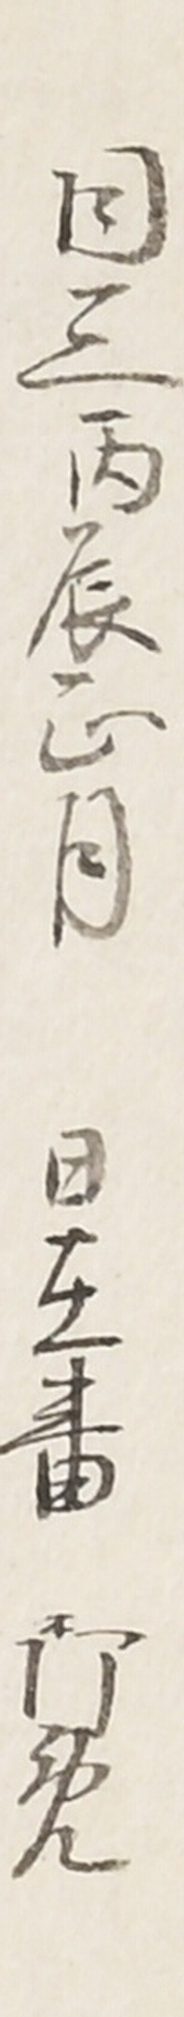一同三丙辰正月日在番御免
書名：無足諸士勤仕録（四）
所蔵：伊那市立高遠町図書館・合同会社AMANE
